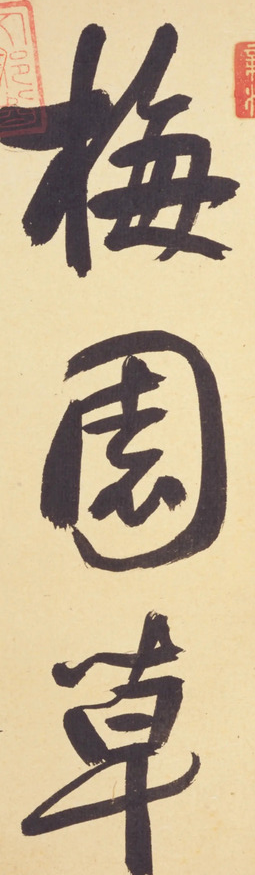梅園草
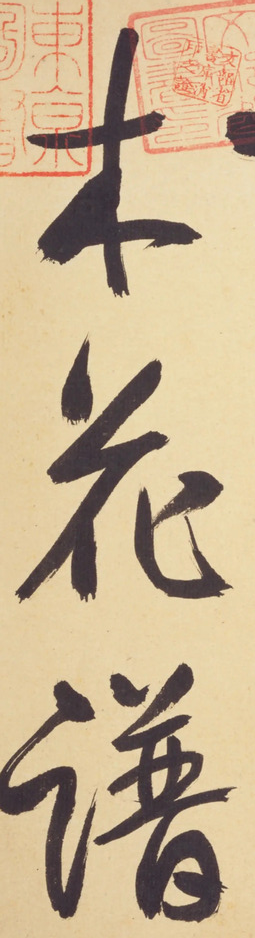木花譜

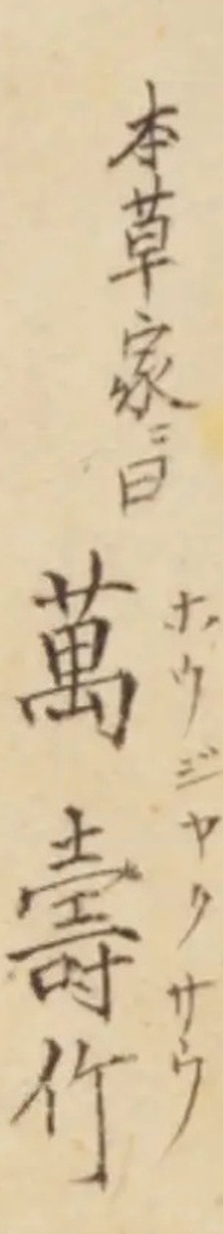本草家日万寿竹
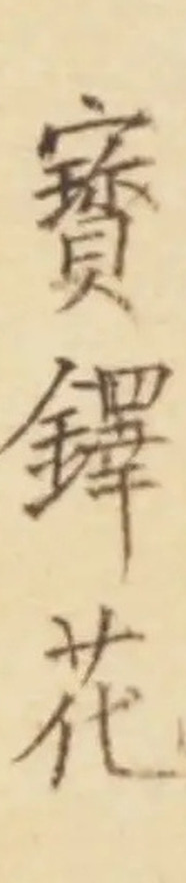宝鐸花
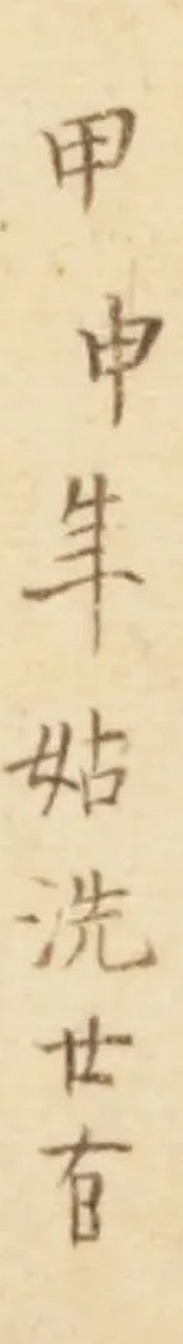甲申年姑洗廿有
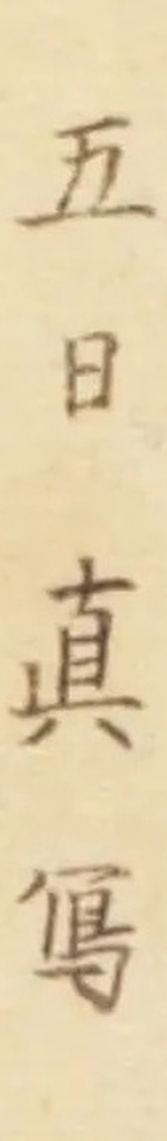五日真冩
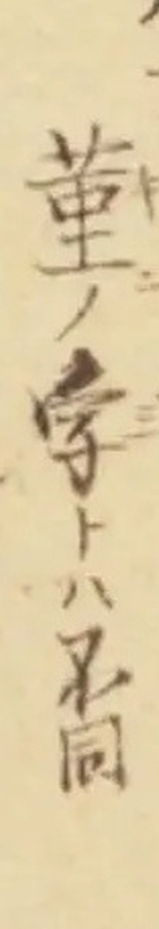菫ノ字トハ不同
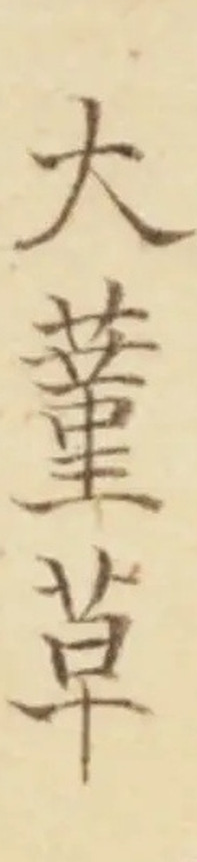胡菫草
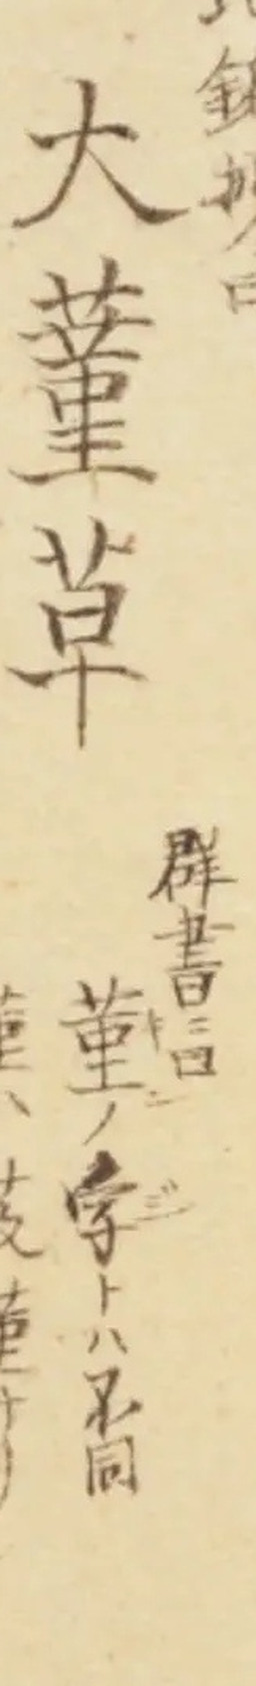蝦夷菫菫ノ字トハ不同
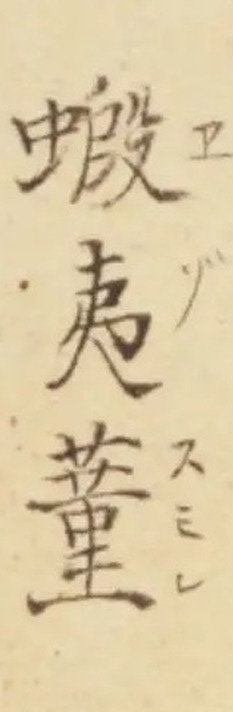蝦夷菫
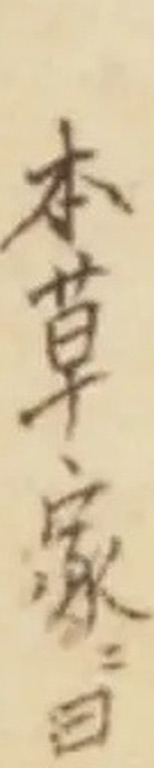本草家日
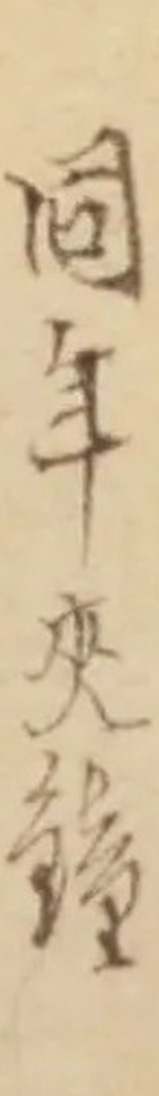同年夾鐘
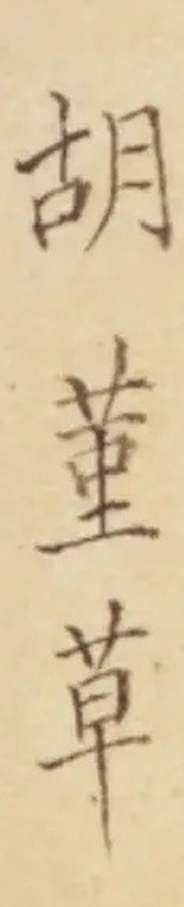胡菫草
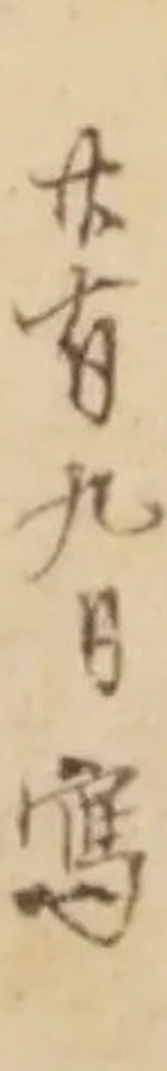廿有九日冩

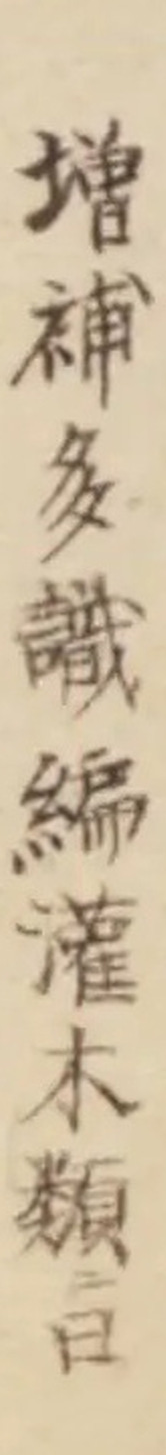増補多識編灌木類ニ曰
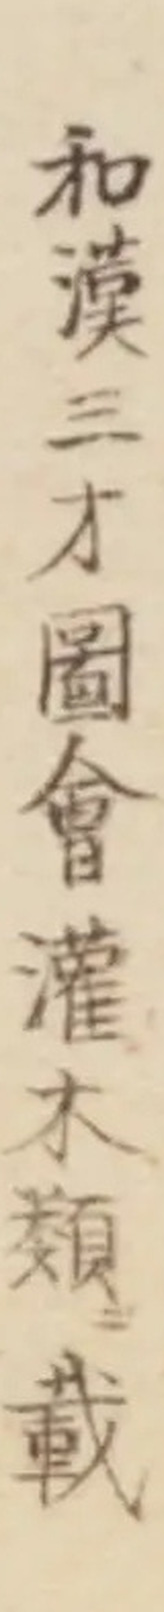和漢三才図会灌木類曰
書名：梅園草木花譜春之部. 2
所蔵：国立国会図書館 National Diet Library, JAPAN
